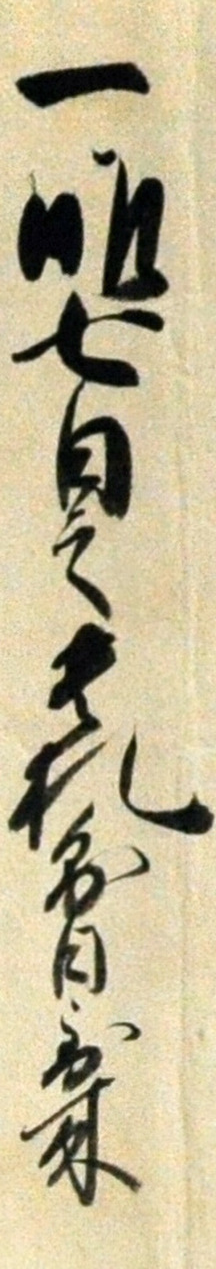一昨七日之貴札即日到来
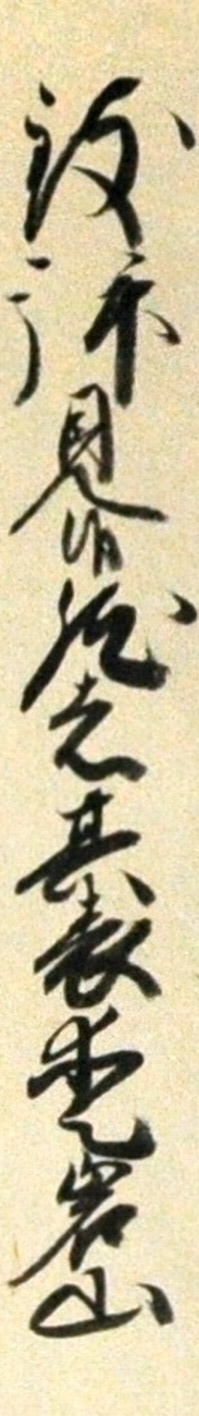致拝見候然者其表愛宕山
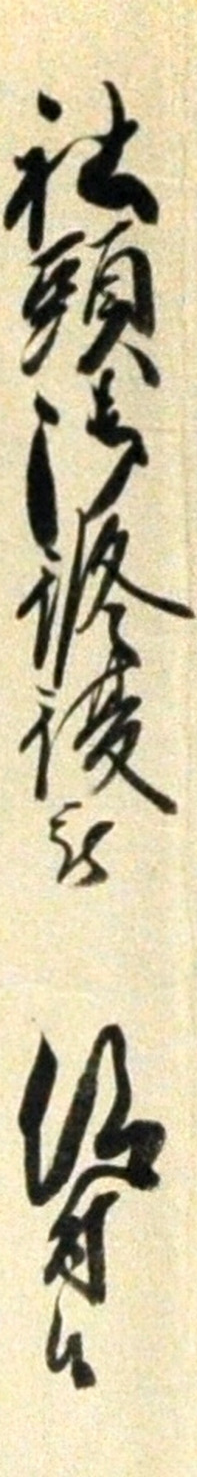社頭御修復被仰付候
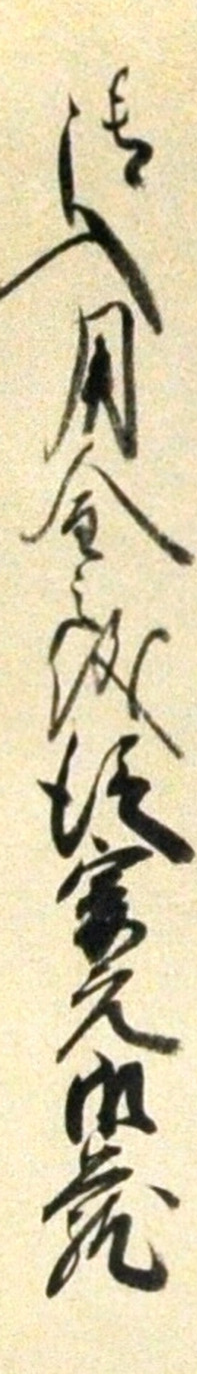御入用金之儀従爰元御蔵
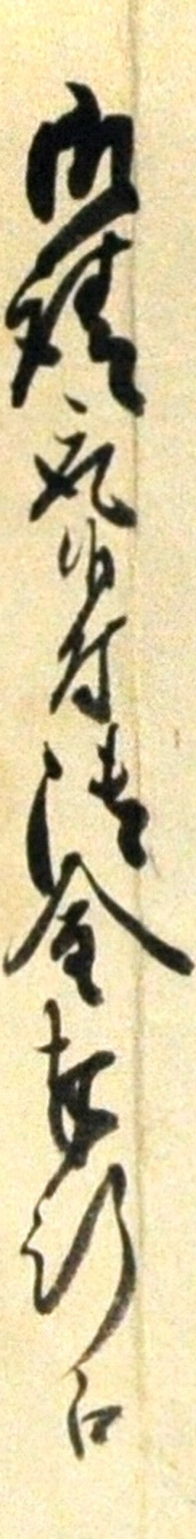御請取候付御金奉行江
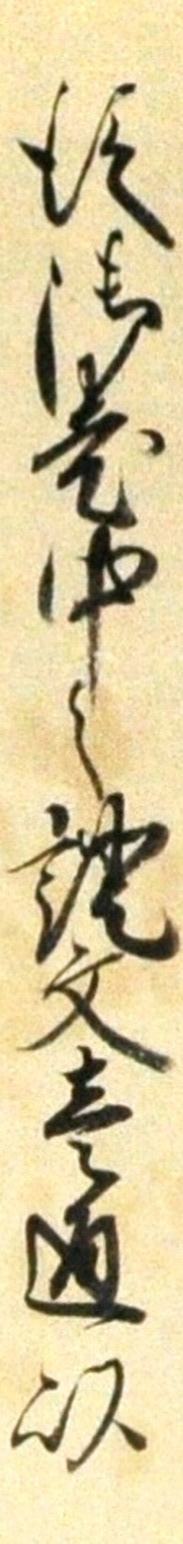従御老中之証文壱通以
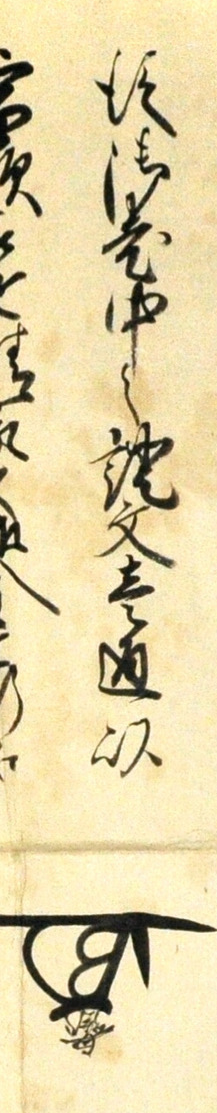従御老中之証文壱通以
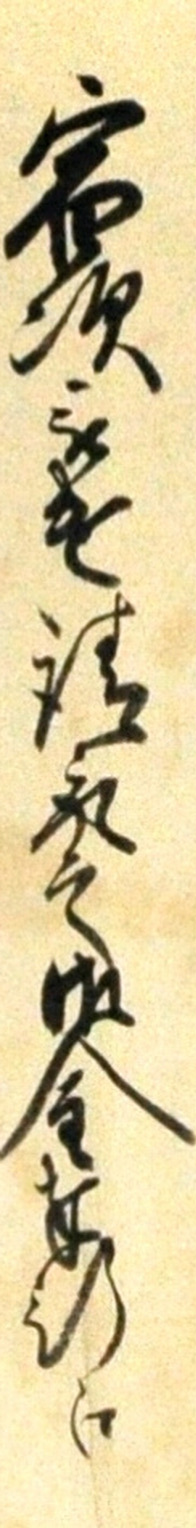宿次被遣請取之御金奉行江
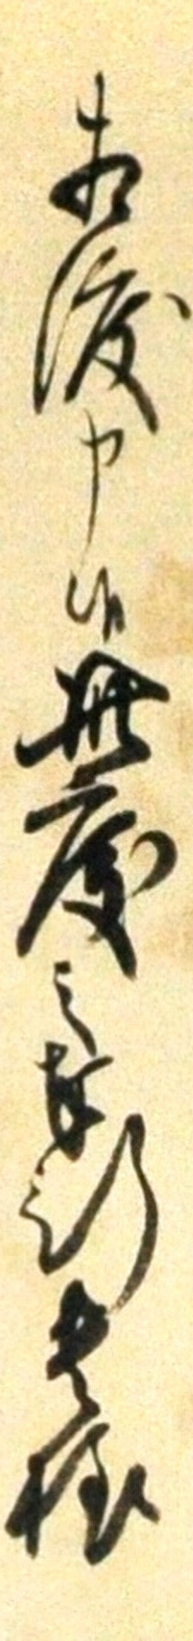相渡申候此度之奉行貴様
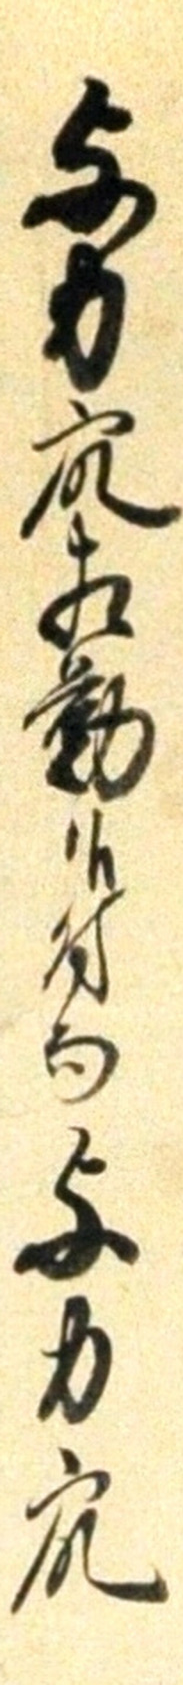与力衆相勤候付而与力衆
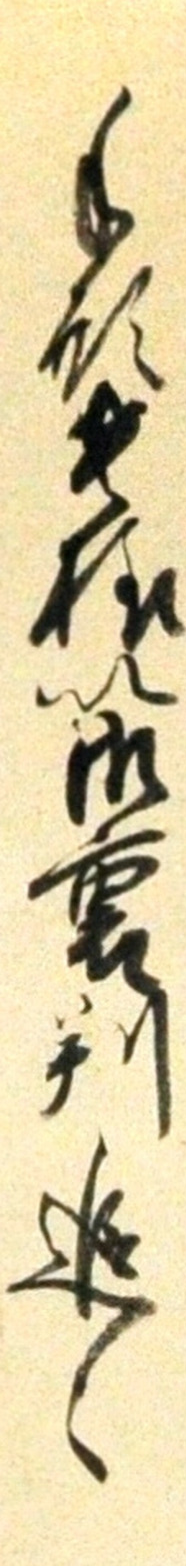手形貴様以御裏判追々
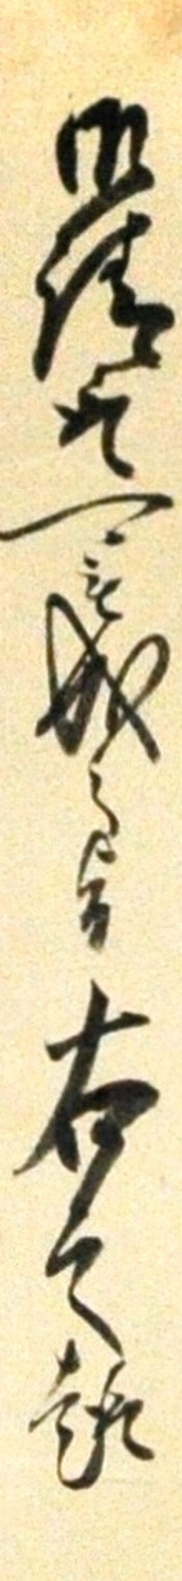御請取可被成之旨右之趣
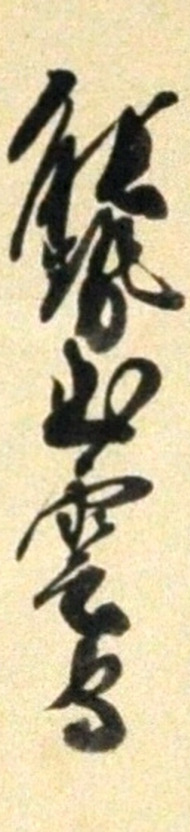能勢出雲守
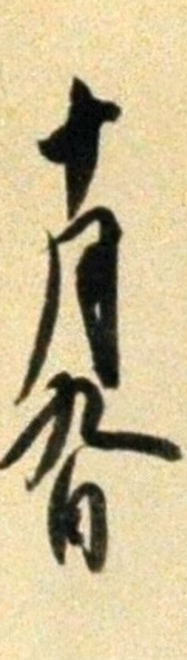十月九日
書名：書状
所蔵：伊那市立高遠町図書館・合同会社AMANE
